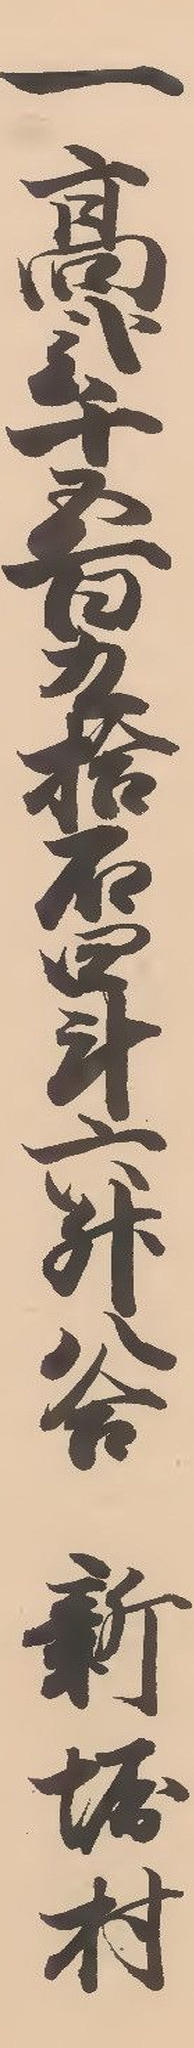一高弐千五百九拾石四斗六升八合新堀村
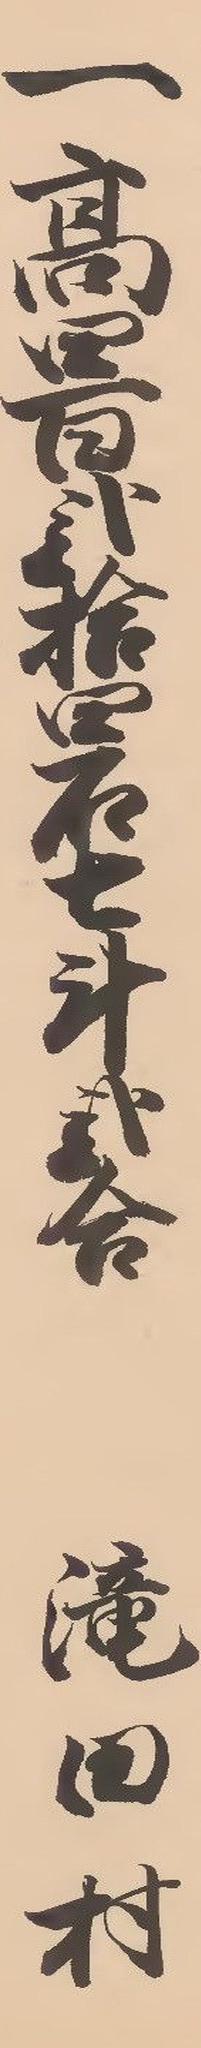一高四百弐拾四石七斗弐合滝田村
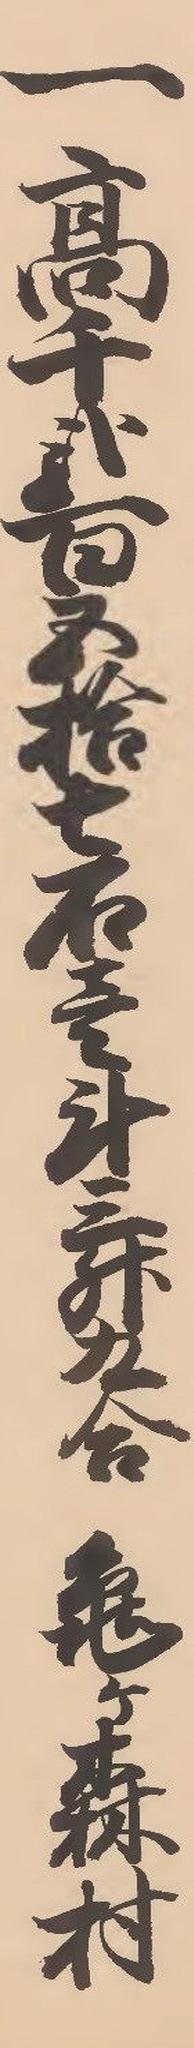一高千弐百五拾七石壱斗三升九合亀ヶ森村
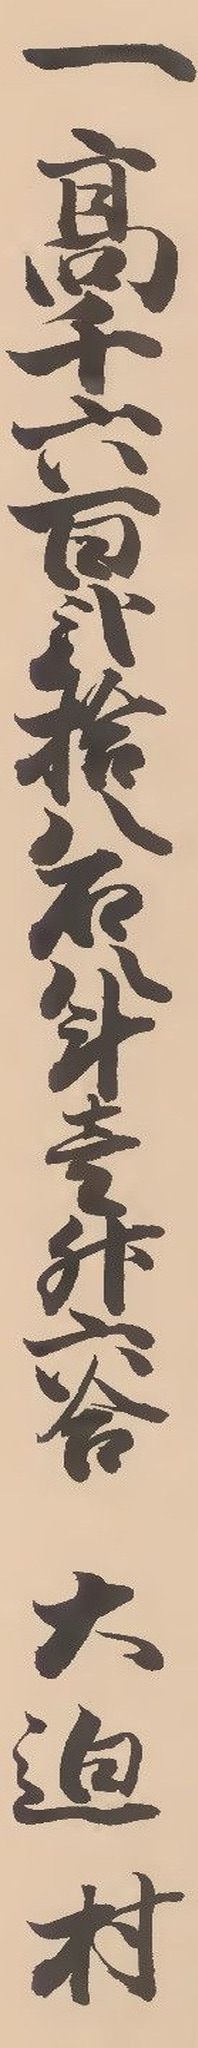一高千六百弐拾八石八斗壱升六合大迫村
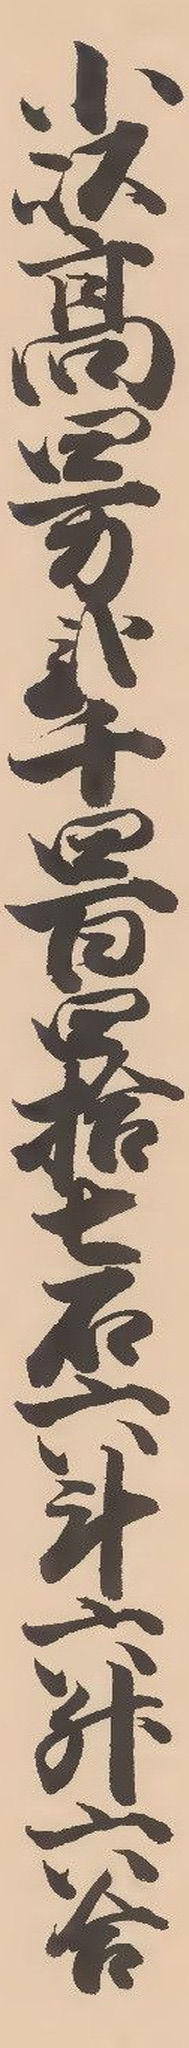小以高四万弐千四百四拾七石六斗六升六合
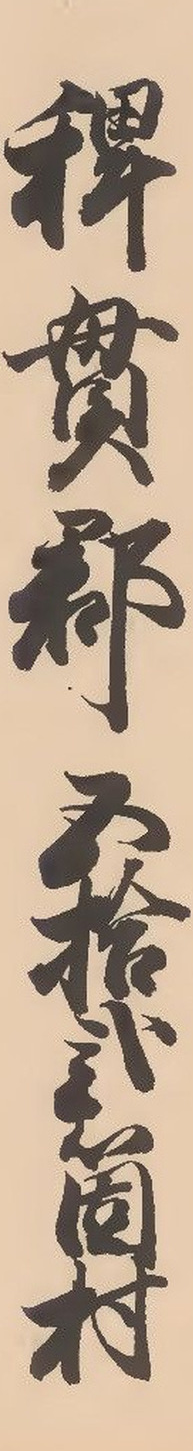稗貫郡五拾弐箇村

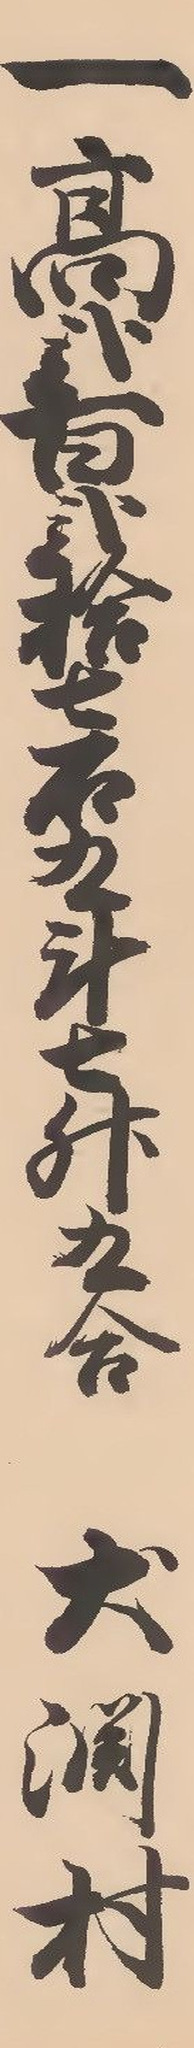一高弐百弐拾七石九斗七升九合犬淵村
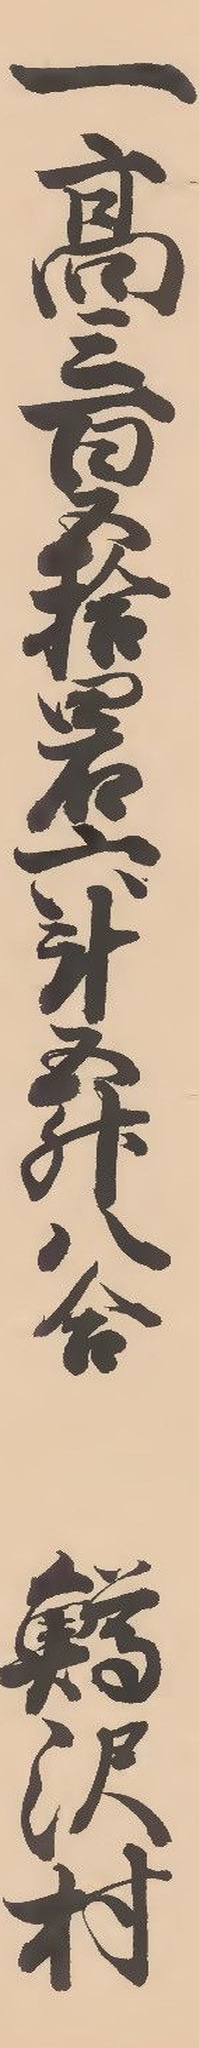一高三百五拾四石六斗五升八合鱒沢村
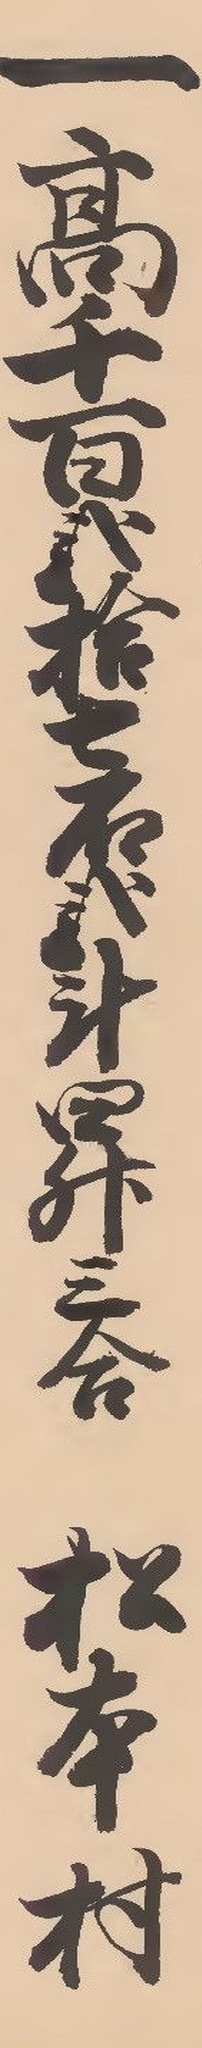一高千百弐拾七石弐斗四升三合松本村
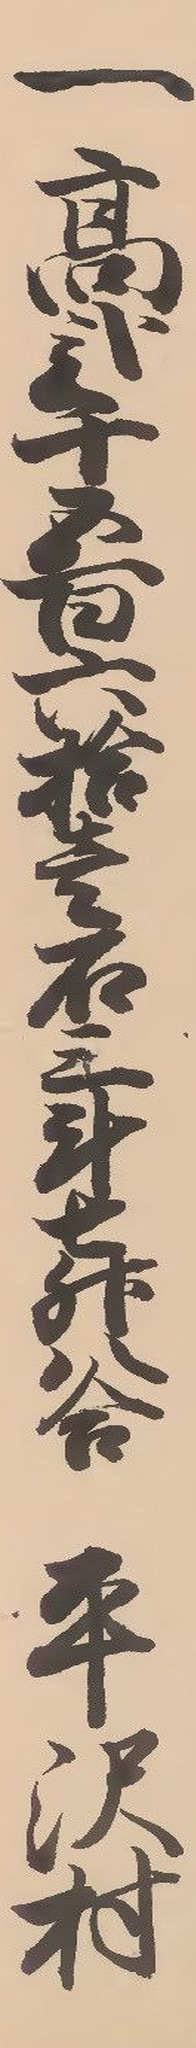一高弐千五百六拾壱石三斗七升八合平沢村
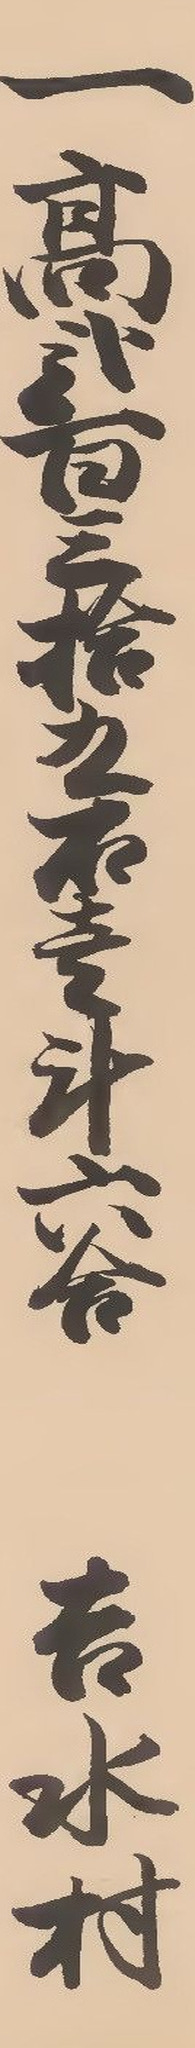一高弐百三拾九石壱斗六合吉水村
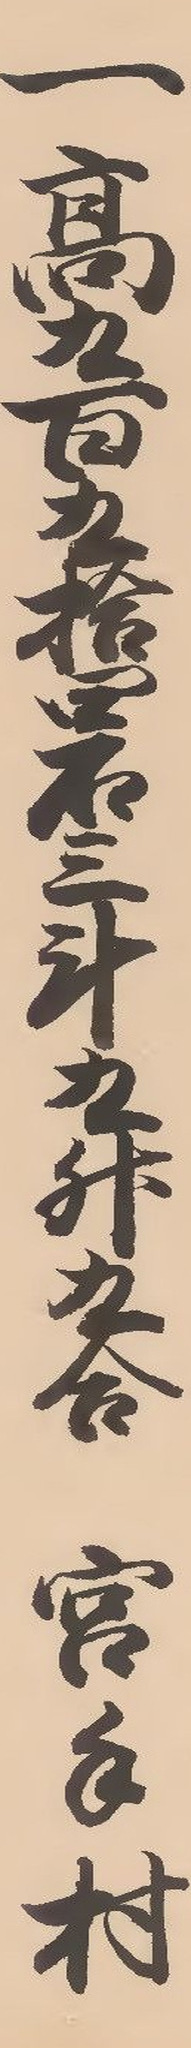一高九百九拾四石三斗九升九合宮手村
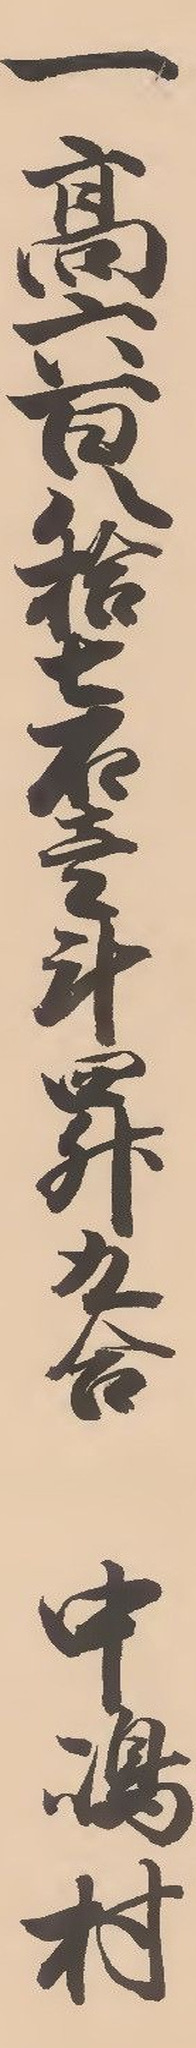一高六百八拾七石壱斗四升九合中島村

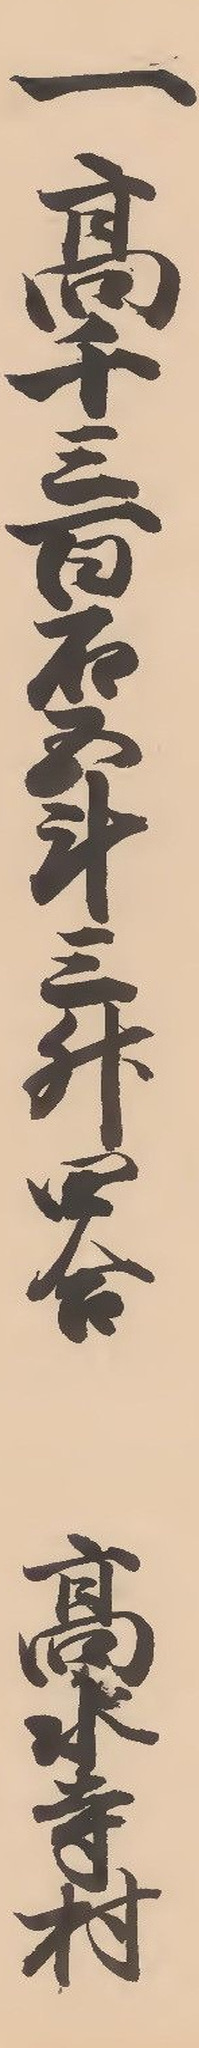一高千三百石五斗三升四合高水寺村
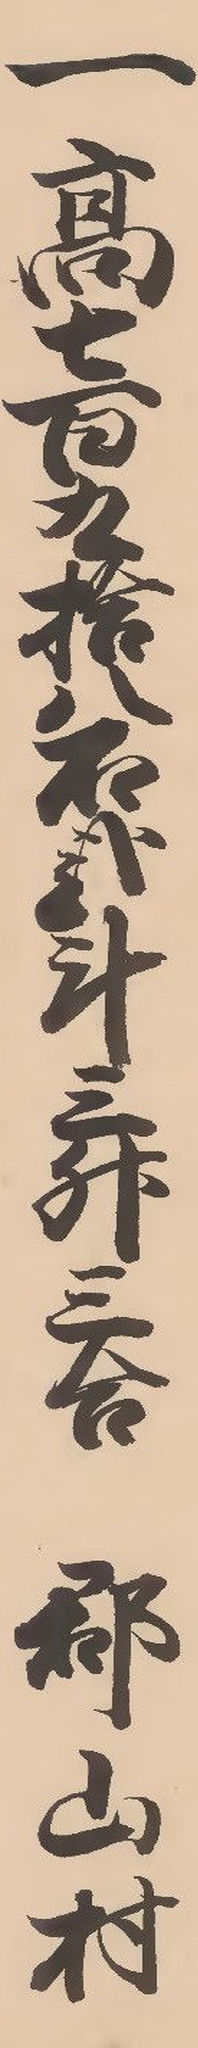一高七百九拾八石弐斗三升三合郡山村
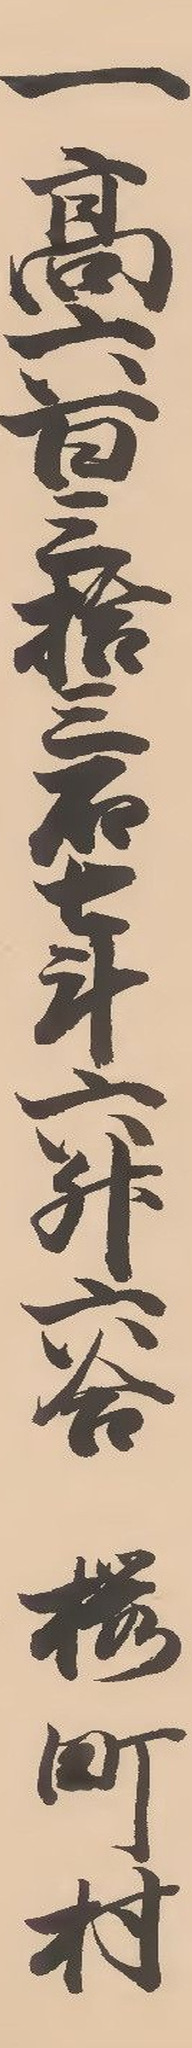一高六百三拾三石七斗六升六合桜町村
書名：陸奥国郷帳　６
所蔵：国立公文書館 National Archives of Japan
